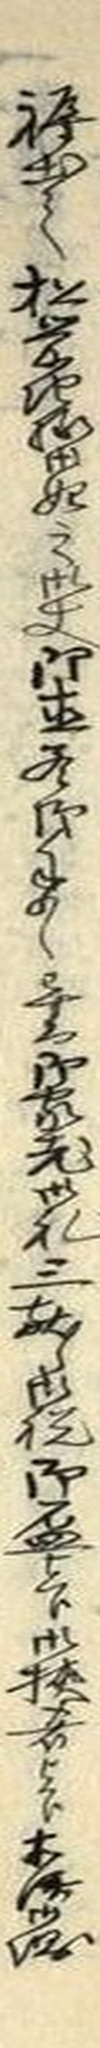褥出之松栄院様御始之御使御直答御手のし畢而御家老御礼三献之御祝御盃被下御挟肴被下相済御側
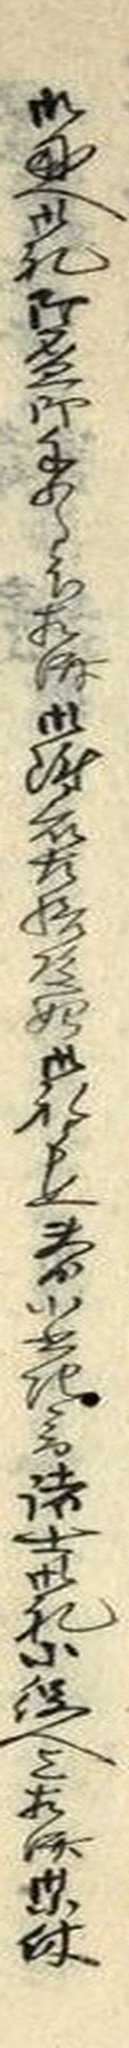御用人御礼御盃御手のし被下相済御附衆左膳殿始御礼申上夫ゟ小書院ニ而諸士御礼小役人迄相済御小休
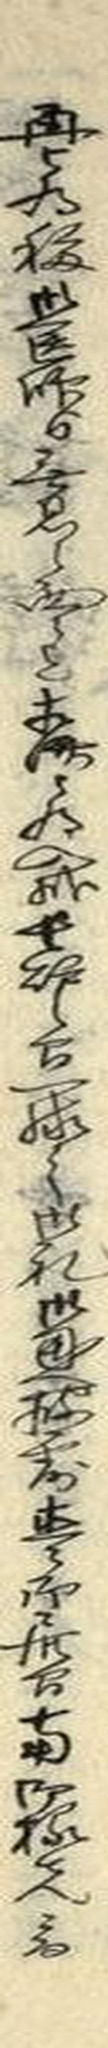再被為移御医師ゟ無息之面々迄相済被為入掛長炉之間一統之御礼御用人披露直ニ御居間南御縁先ニ而
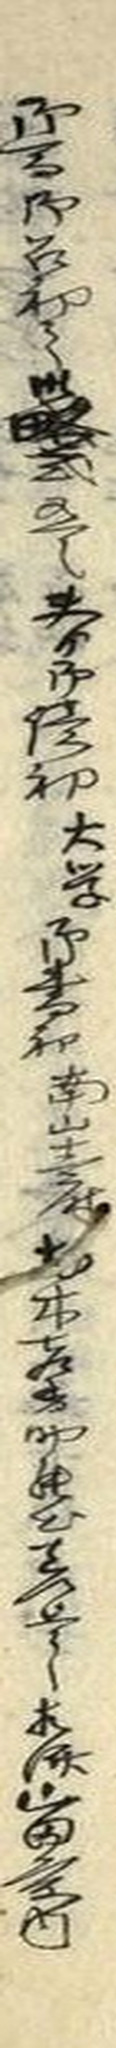御馬御召初之御略式有之夫ゟ御読初大学御書初南山寿花木馨助罷出差上之相済山田藤内
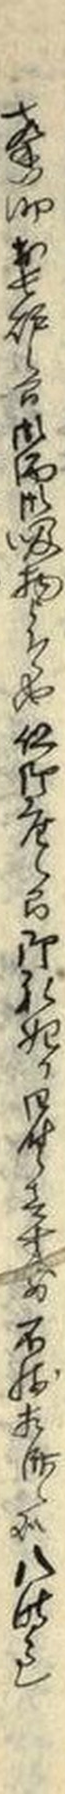別当助於長炉之間御酒御吸物被下候由但御座之間御礼始り四時壱寸前不残相済候処八時過
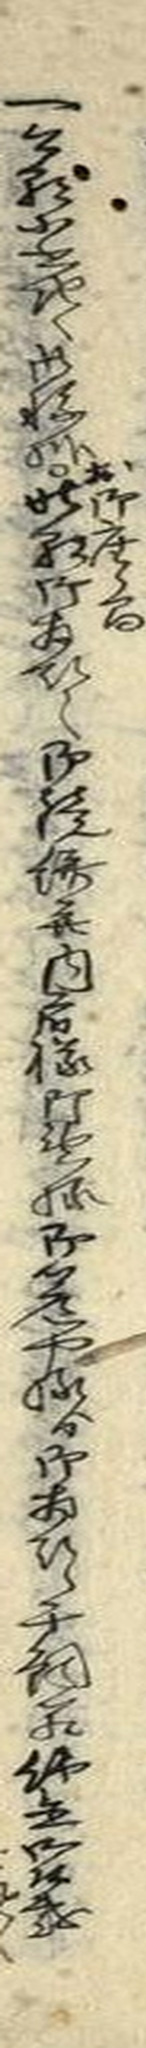一今朝小書院へ御移掛於御座之間昨朝御拝領之御鏡餅并内府様御台様御簾中様ゟ御拝領之干鯛箱飾置御頂戴被遊候

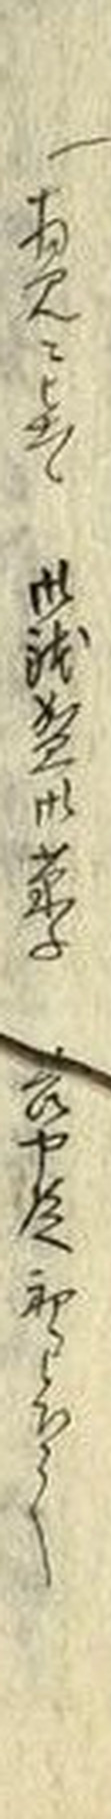拝見ニ被出候御鉢盛御菓子谷中殿初へ被下之
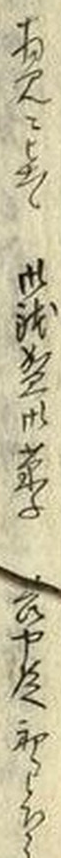拝見ニ被出候御鉢盛御菓子谷中殿初へ被下之
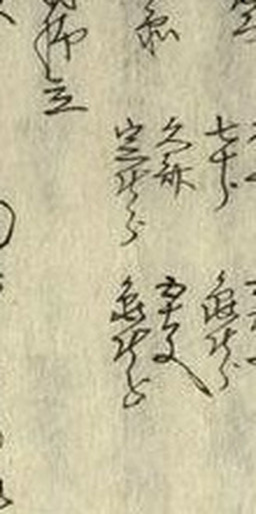定次郎亀次郎
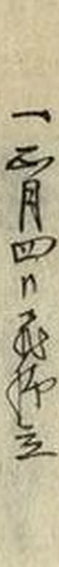一正月四日飛脚立
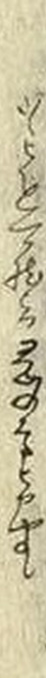ツヽ被進可然旨岡の方被申聞候
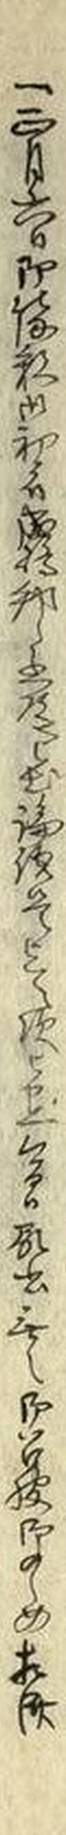一正月六日御講釈御初ニ付成嶋邦之丞殿被出論語是迄之次被申上今日ハ歌書無之御召服御のしめ相済
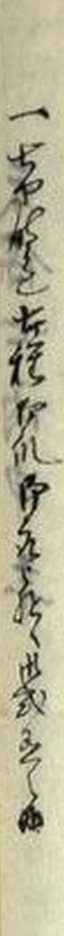一七半時過左膳御爪御取被遊候御式有之由
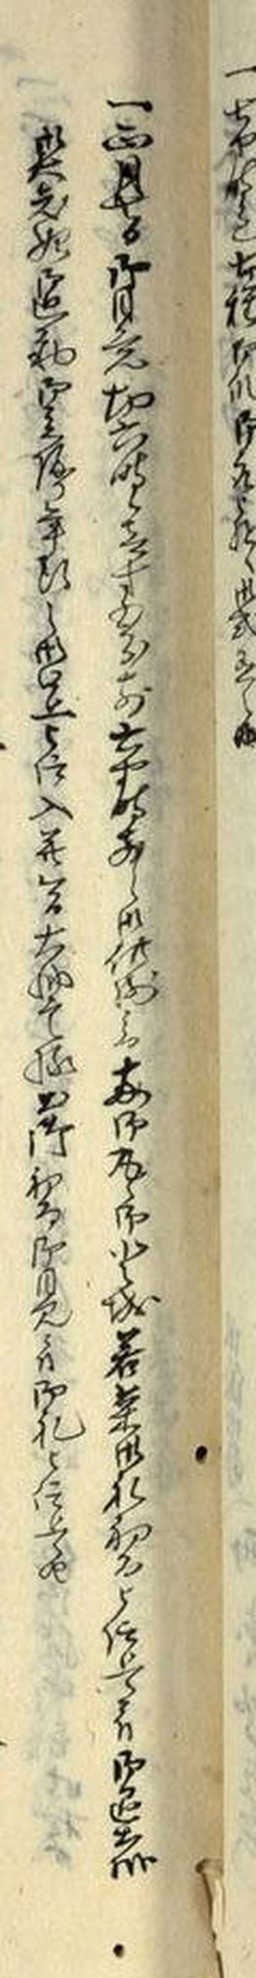一正月七日御目覚切六時へ壱寸五分前六半時前之御供揃ニ而両御丸へ御登城若菜御礼初而被仰上候ニ付御退出掛
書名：少傅日録抄（斉善付側向頭取日記、在府）
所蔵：福井県文書館 Fukui Prefectural Archives
